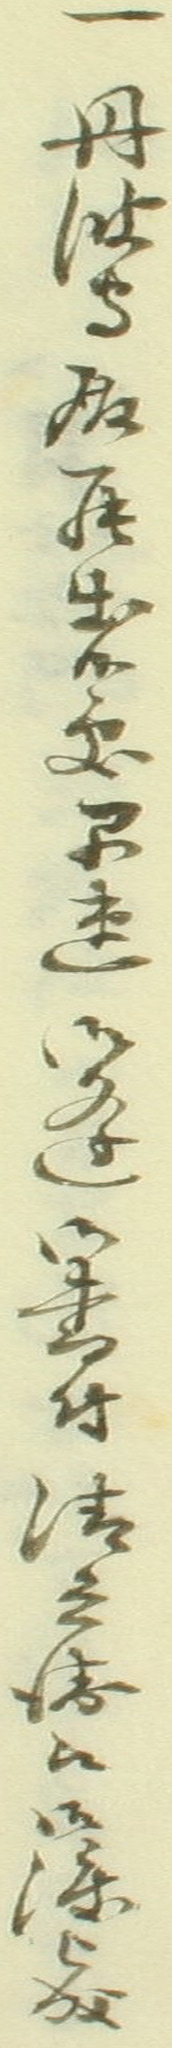一丹波守殿罷出候処早速御逢御書付清兵衛え御渡被成
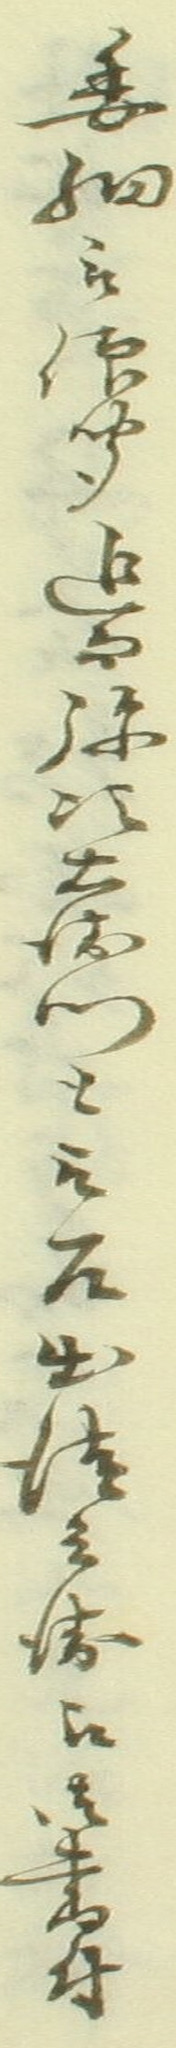委細被仰聞追而弥次右衛門も被召出清兵衛え御書付
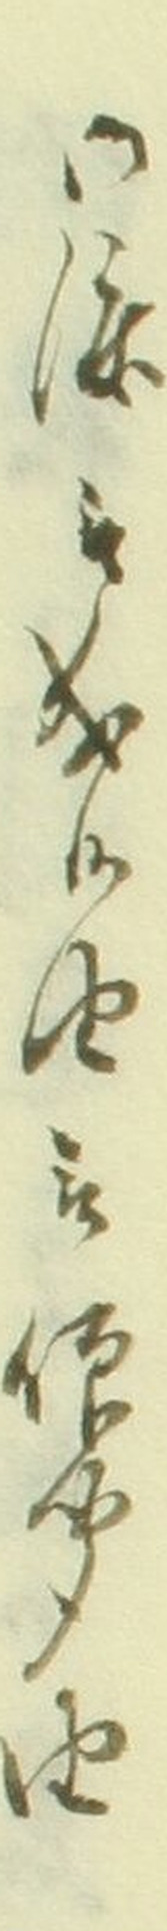御渡被成候由被仰聞由
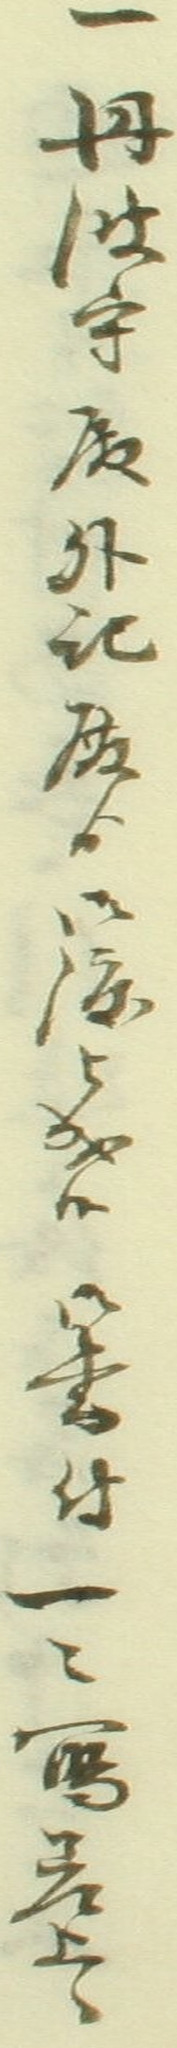一丹波守殿外記殿ゟ御渡被成候御書付一々写差上候
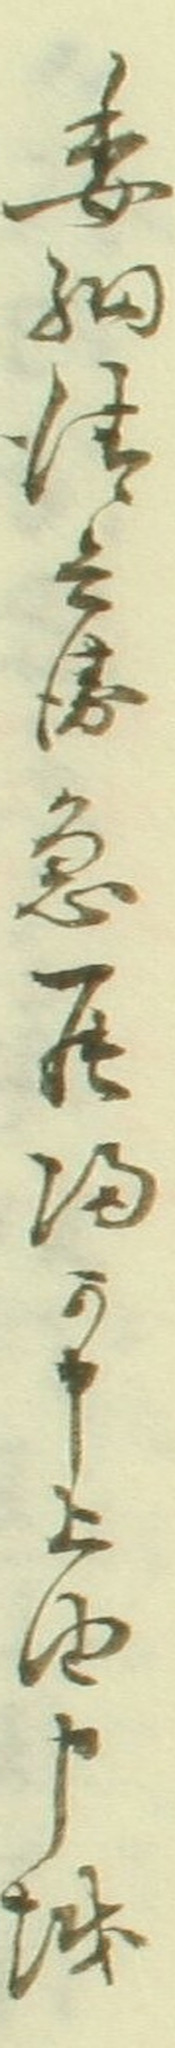委細清兵衛急罷帰可申上由申越
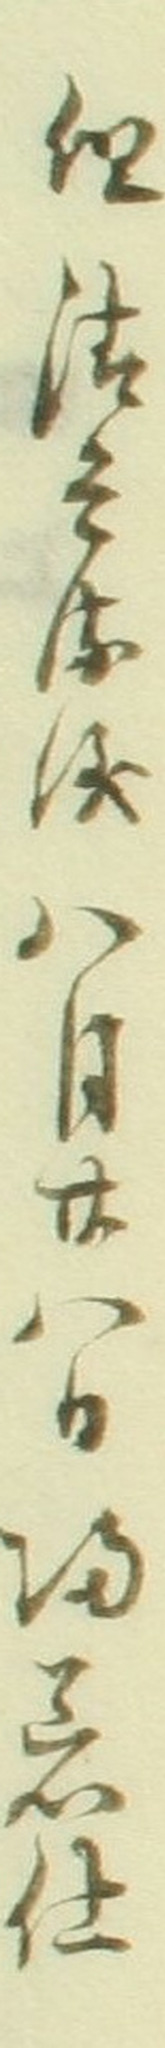但清兵衛儀八月廿八日帰着仕

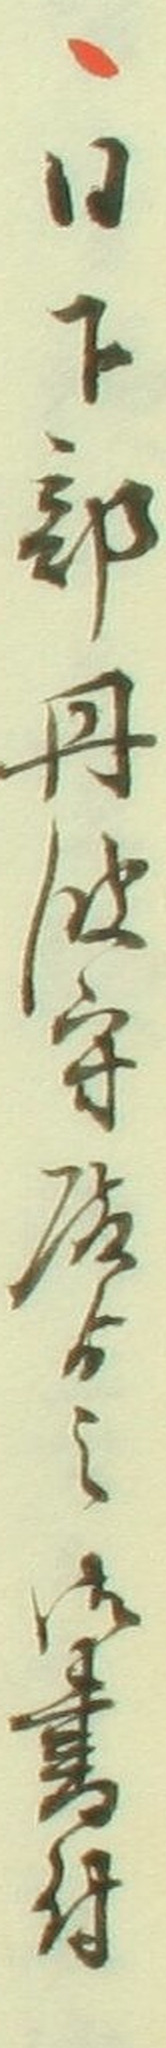日下部丹波守殿ゟ之御書付
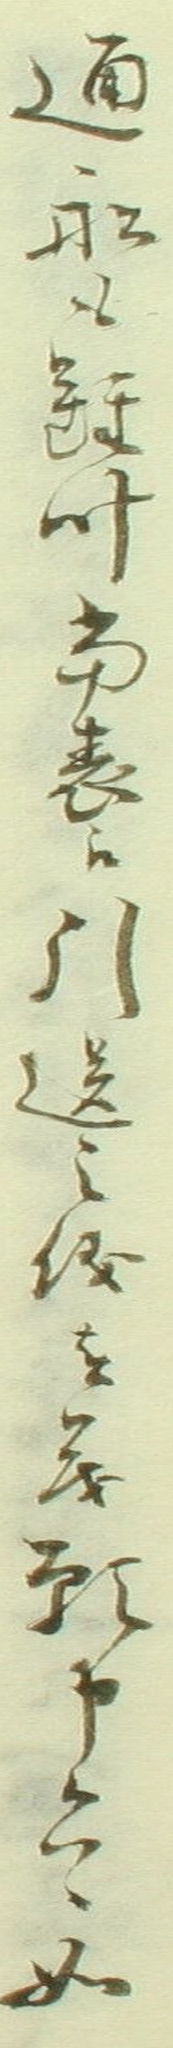通船も難叶当表え引送之儀を茂願申候はゝ如
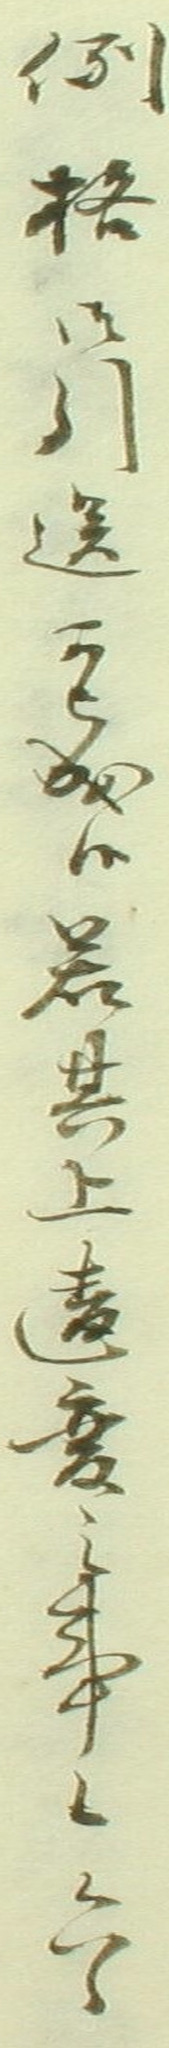例格御引送可被成候若其上違変之事も候はゝ
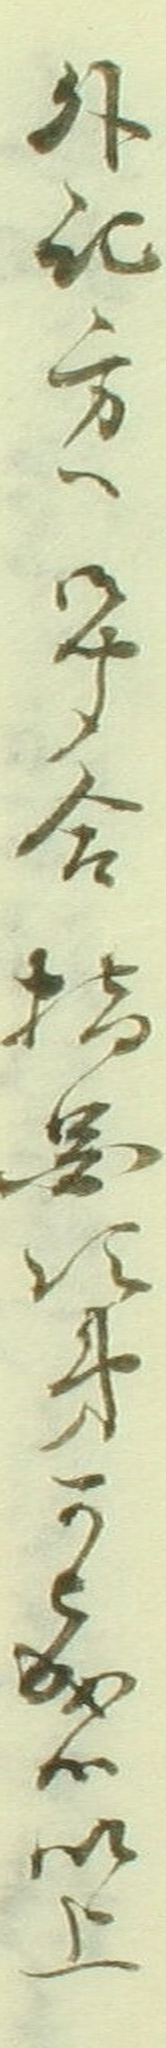外記方へ御聞合指図次第可被成候以上
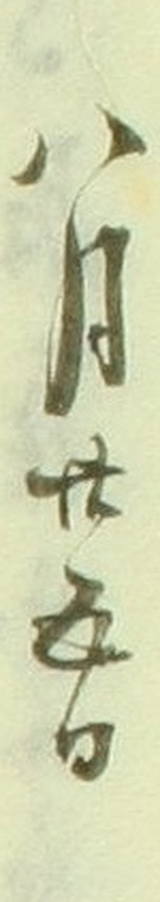八月廿五日
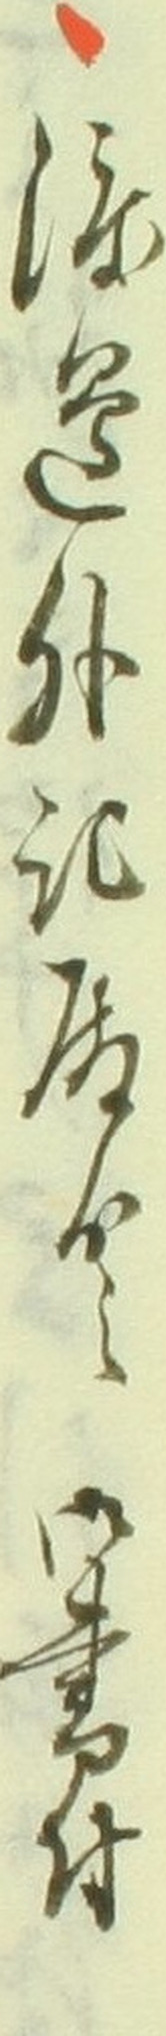渡辺外記殿ゟ之御書付
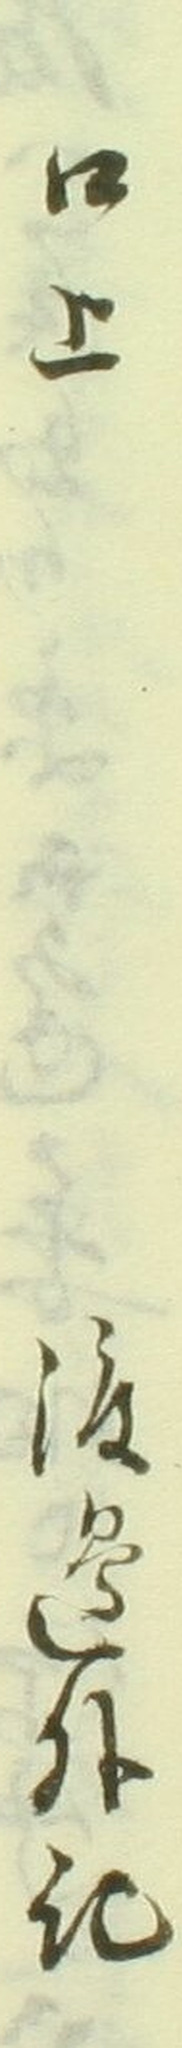口上渡辺外記
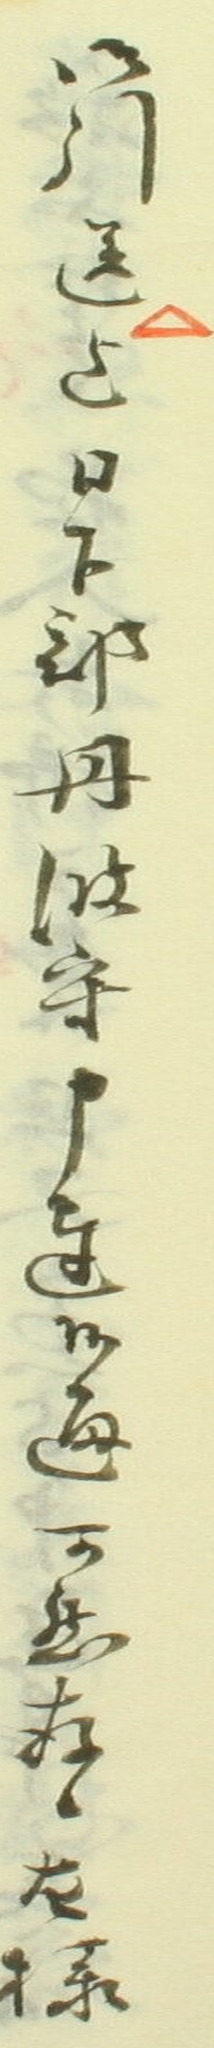御引送迄日下部丹波守申達候通可然存候左様
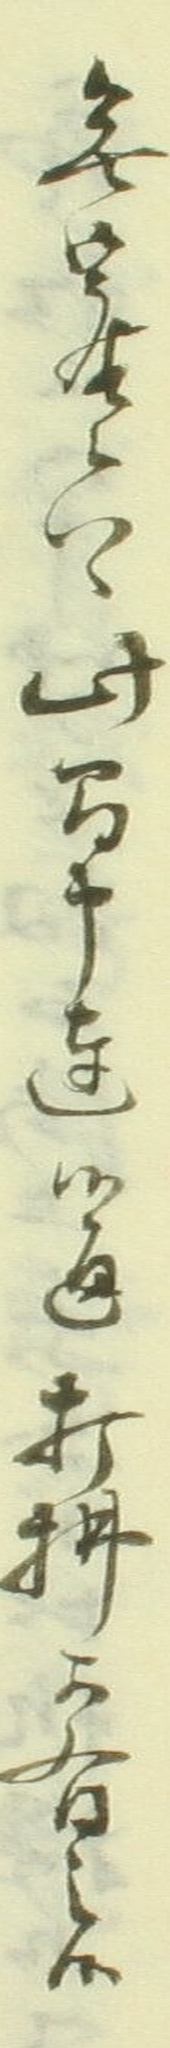無御座候はゝ此間申達候通打払可有之候
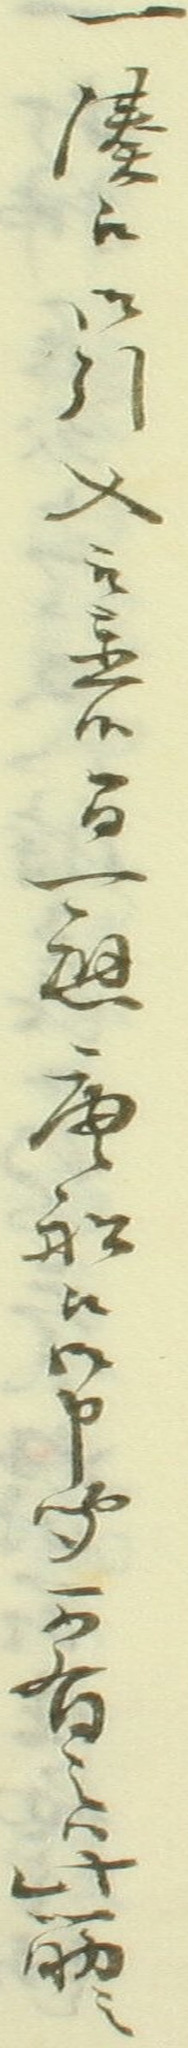一港え御引入被置候間一応唐船え御申聞可有之は此筋之
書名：異国船漂着記
